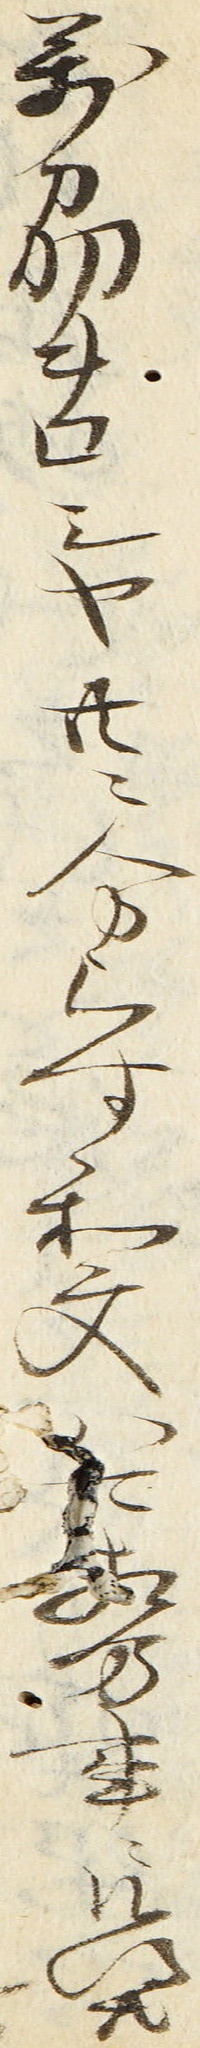万州ヲロシヤ共に分らす和文は可相分事に候得共
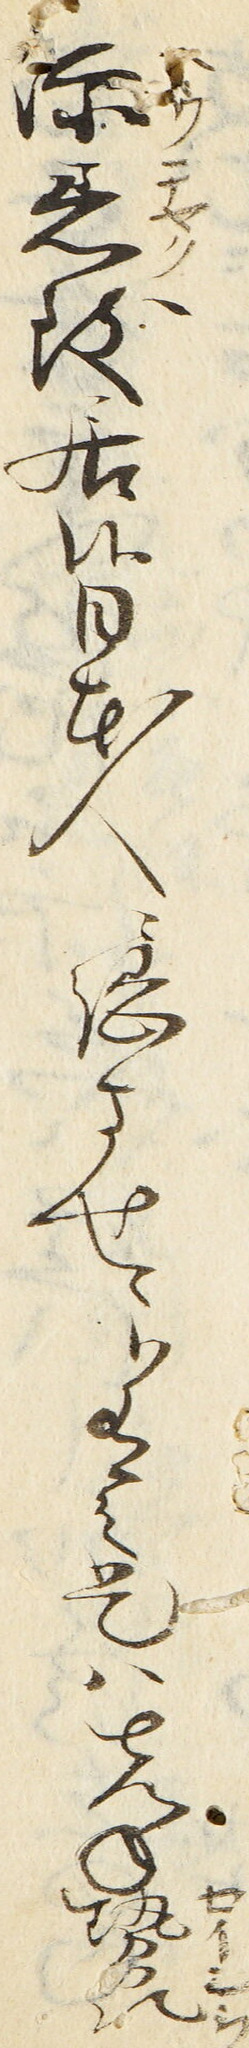漂着致居候日本人に認させ候と有之是は先年勢州

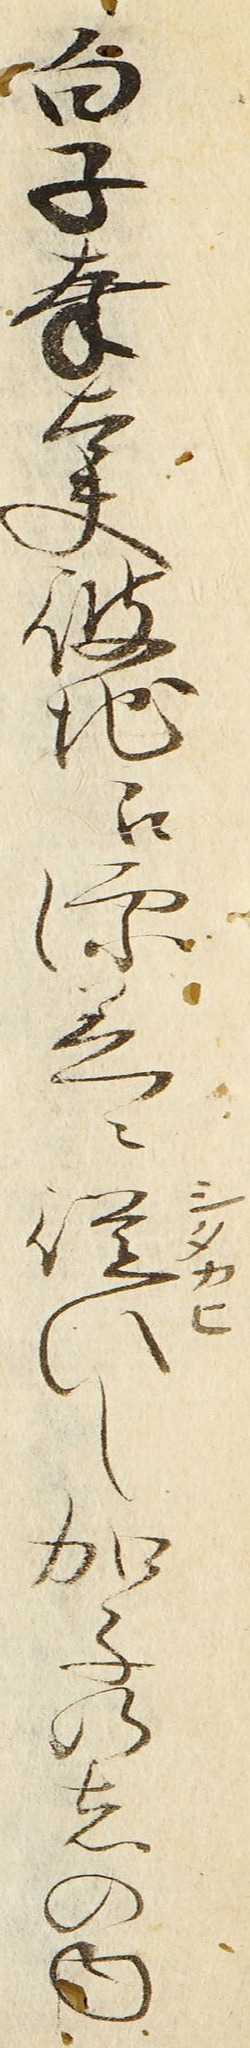白子幸太夫彼地え漂着に従ひし加子の者の内
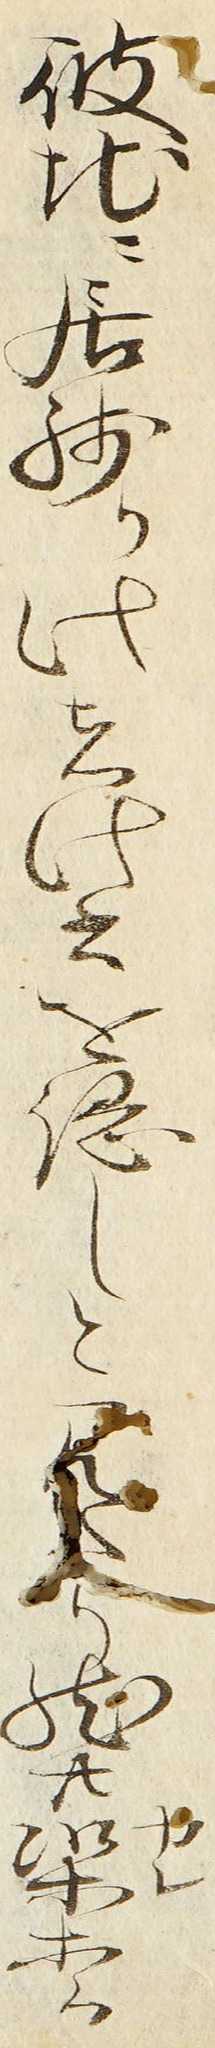彼地に居残り此者此書を認しと見へり然共渠等は
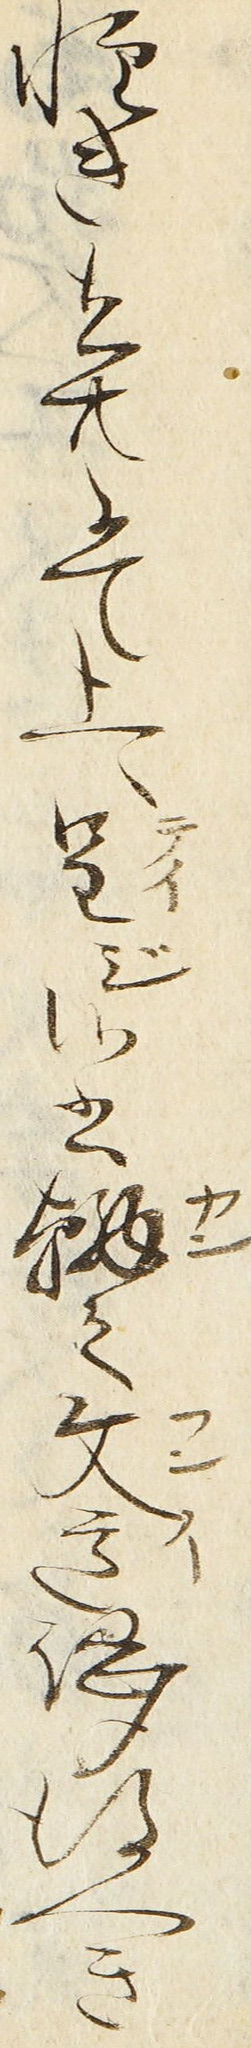軽き者共にて上へ呈じ候書翰文意認め得へき
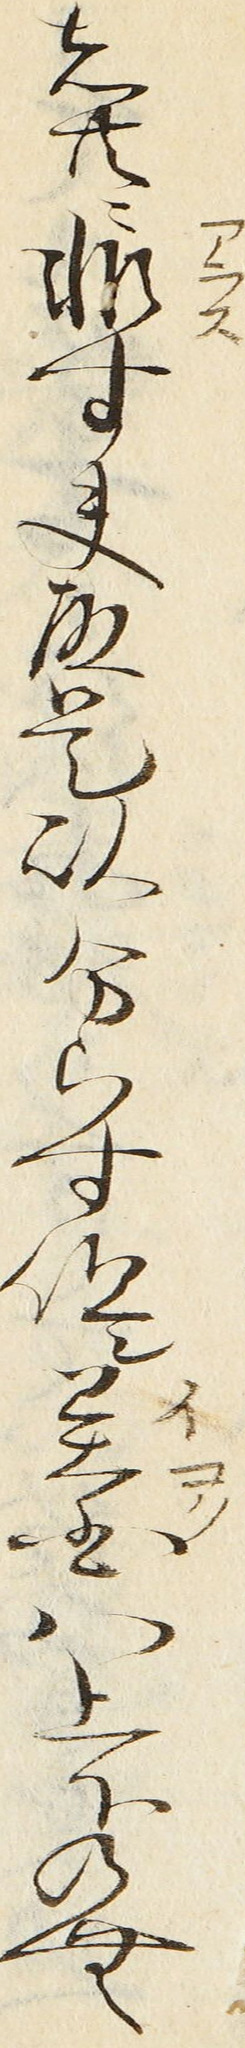者共に非す夫故是以分らす但し異国は上下の無
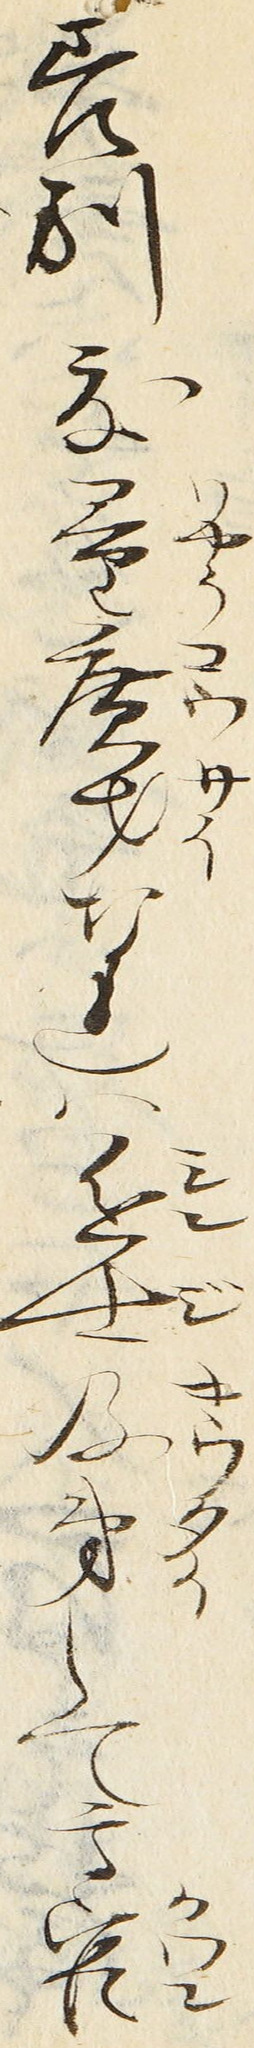差別度量広才なれは進士及第して高官
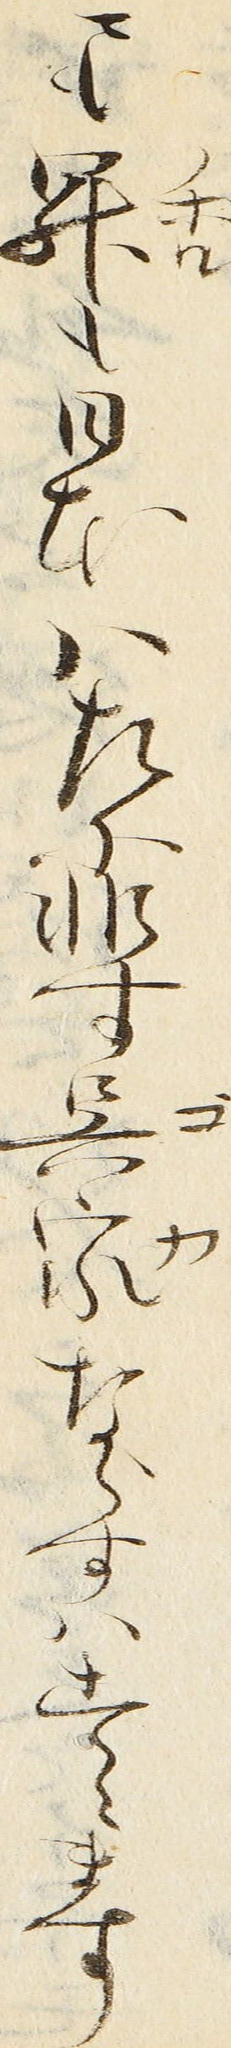にも昇も日本は左に非す呉家ならすはすゝます
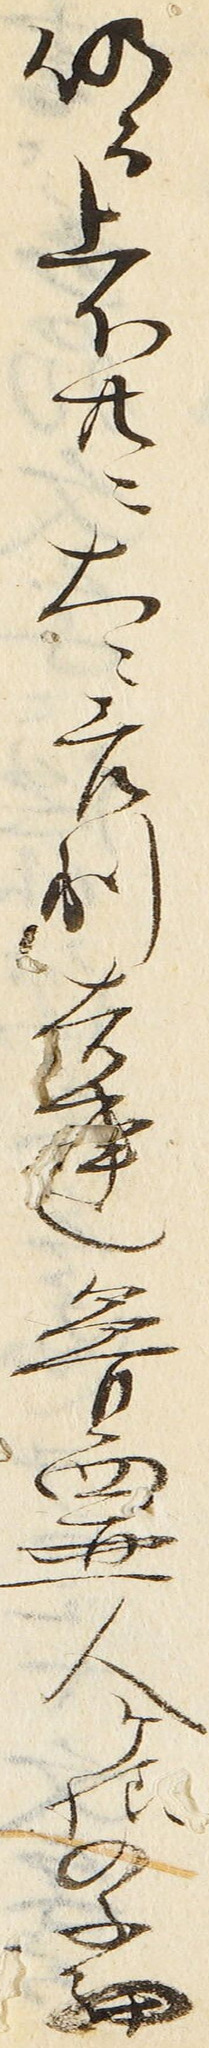仍て上下共に大に差別有事也魯西亜人ヶ様の子細
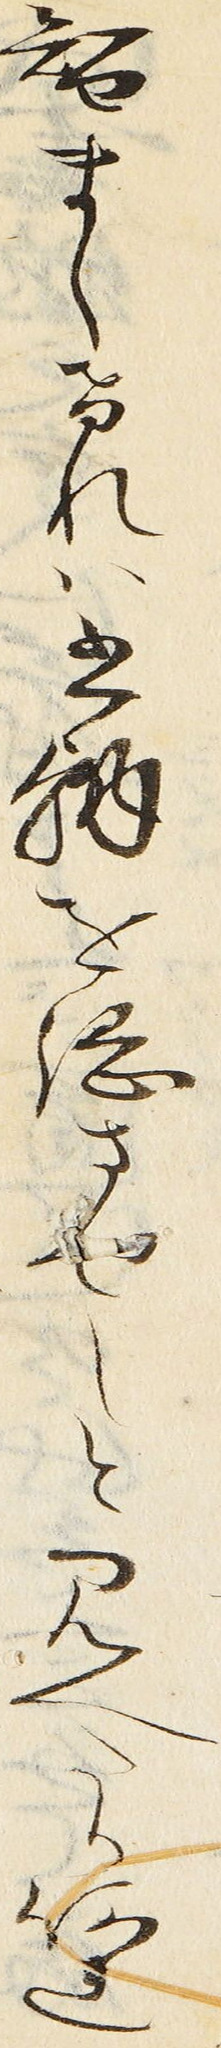智ましけれは書翰を認させしと見へたり何れ
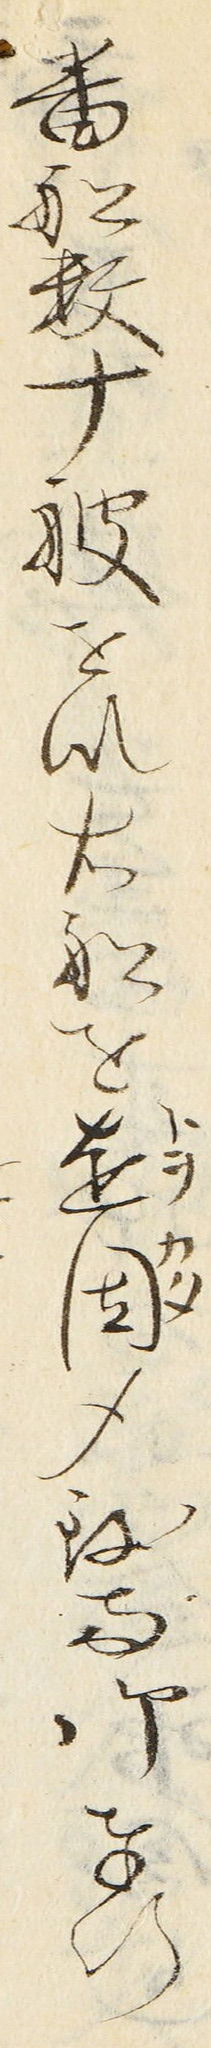番船数十艘を以右船を遠固め致両御奉行
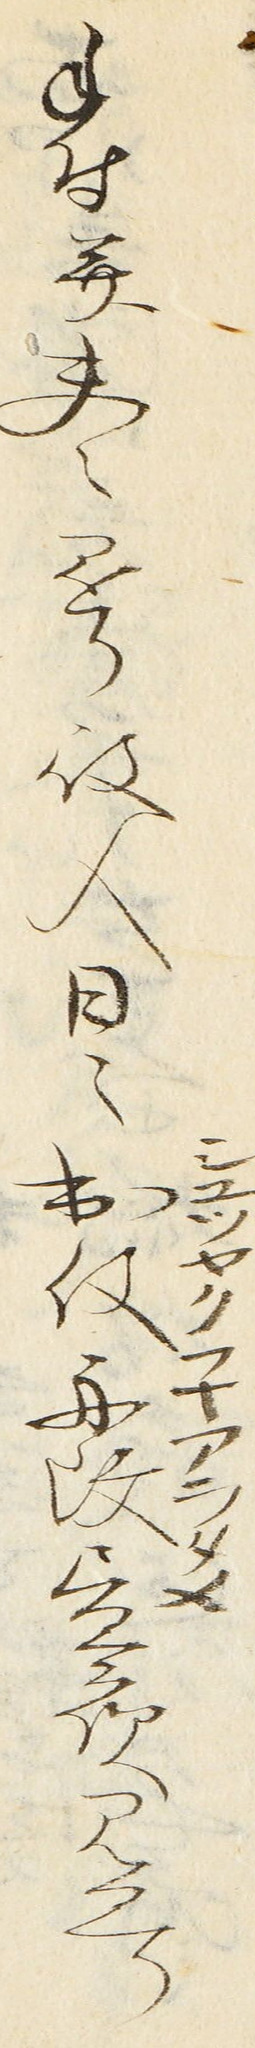手付幷夫々懸り役人日々出役舟改昼夜見廻り
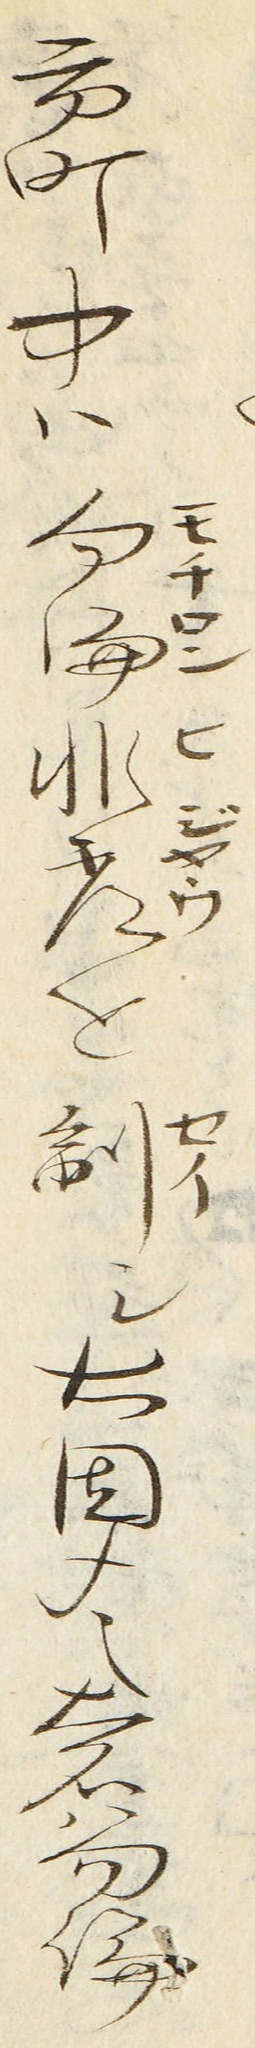市町中は勿論非常を制し右固め之大名は勿論

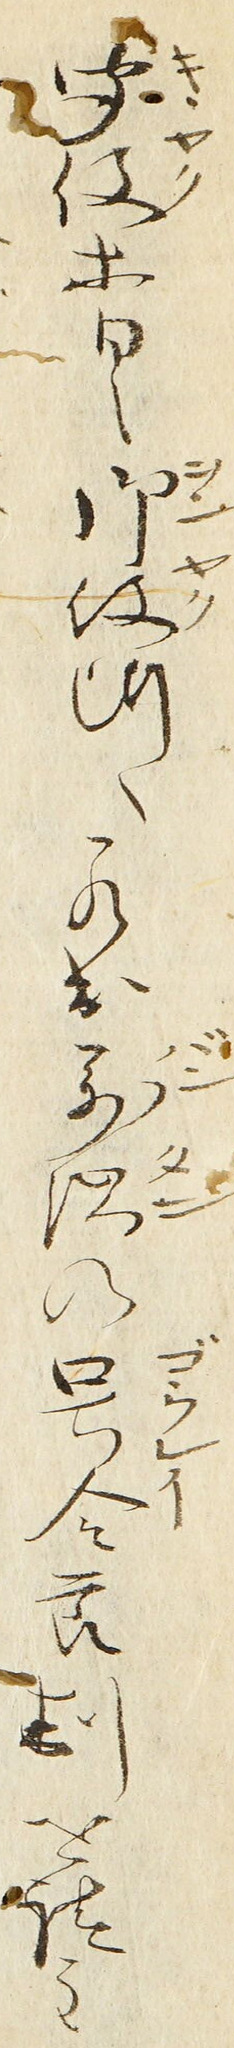聞役等日々御役所へ罷出万端の号令節制を請て
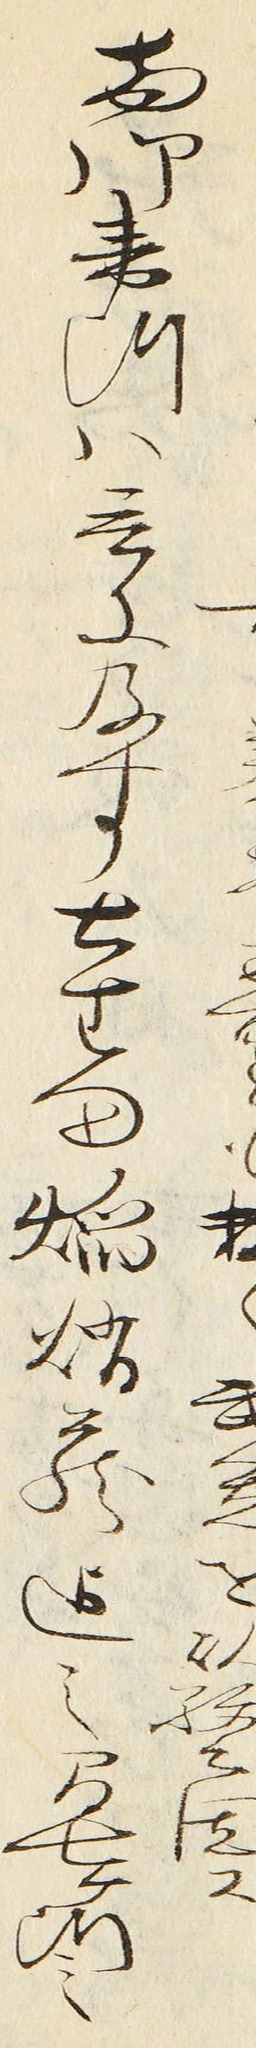両御番所は云に及す土生田焔焇蔵迄之間七ヶ所之
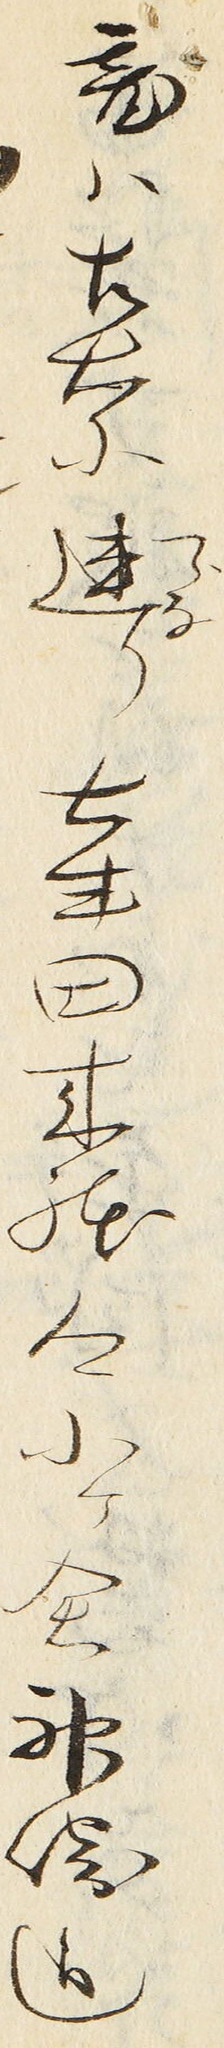台は左右に連り土生田来鉢郷小ヶ倉神崎辺
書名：魯西亜国舟渡来始末并日本流漂人異国遍歴之話（西洋欧羅巴州之内一）
